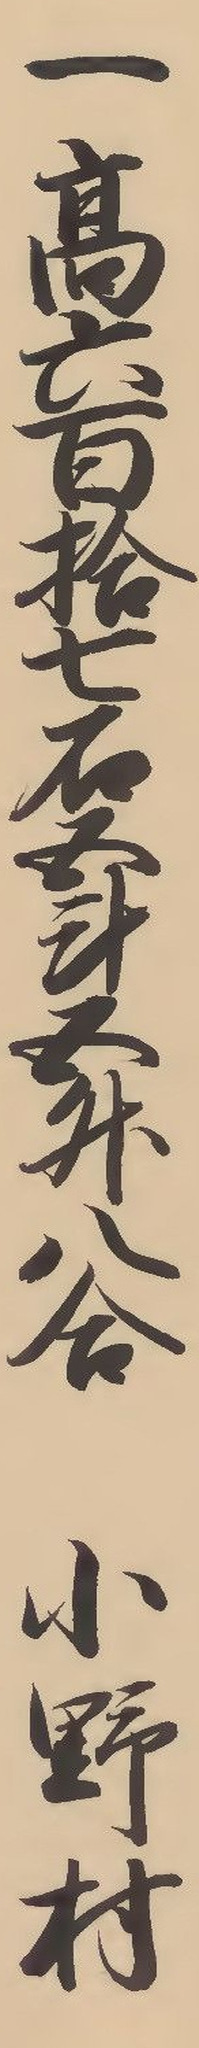一高六百拾七石五斗五升八合小野村
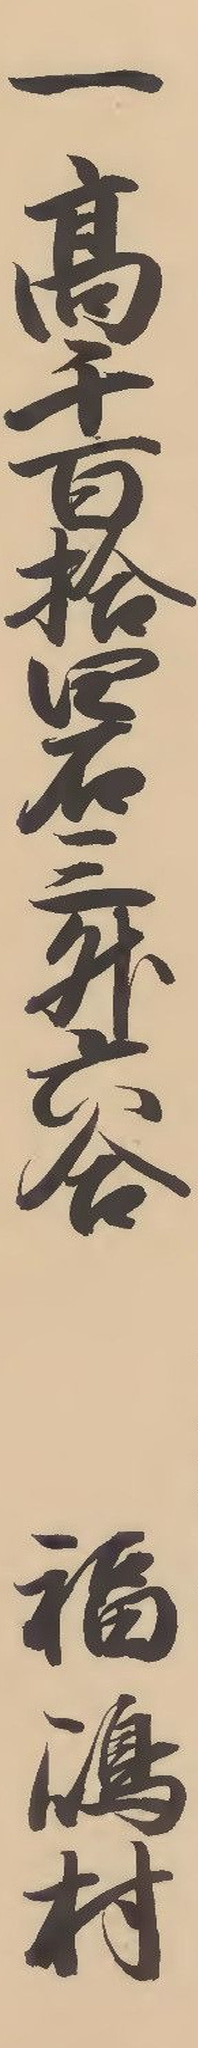一高千百拾四石三升六合福島村

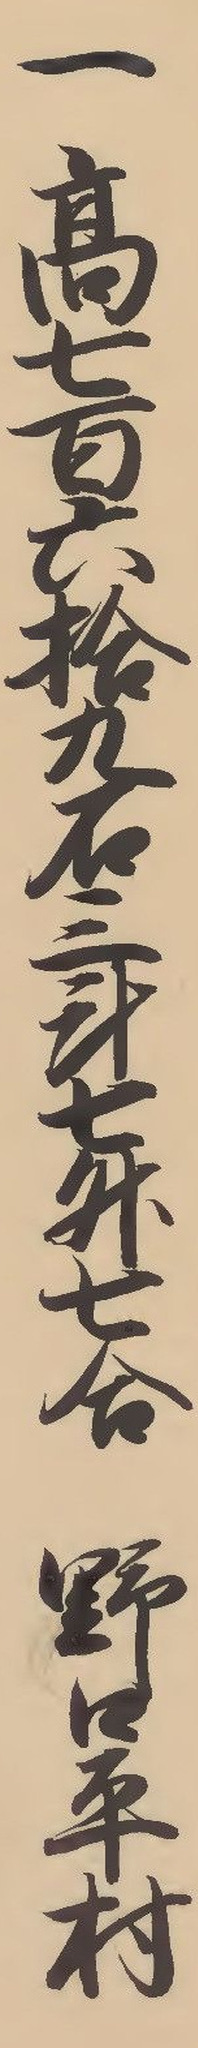一高七百六拾九石三斗七升七合野口平村
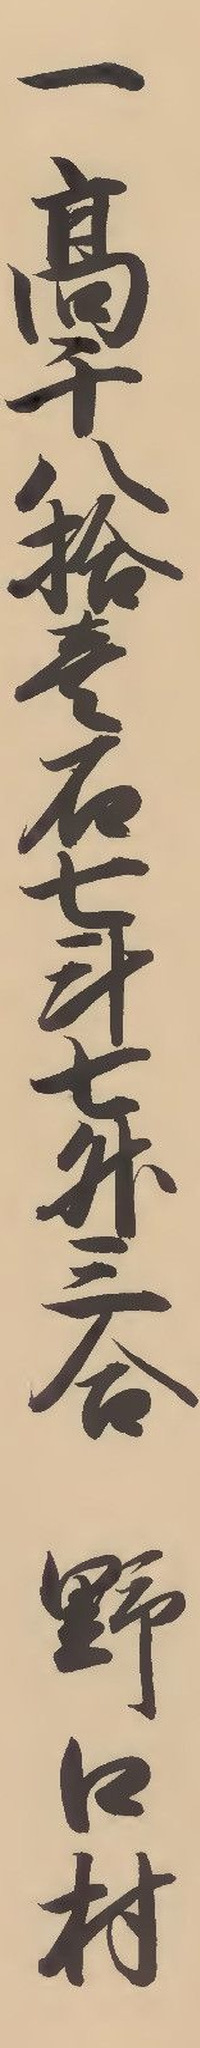一高千八拾壱石七斗七升三合野口村
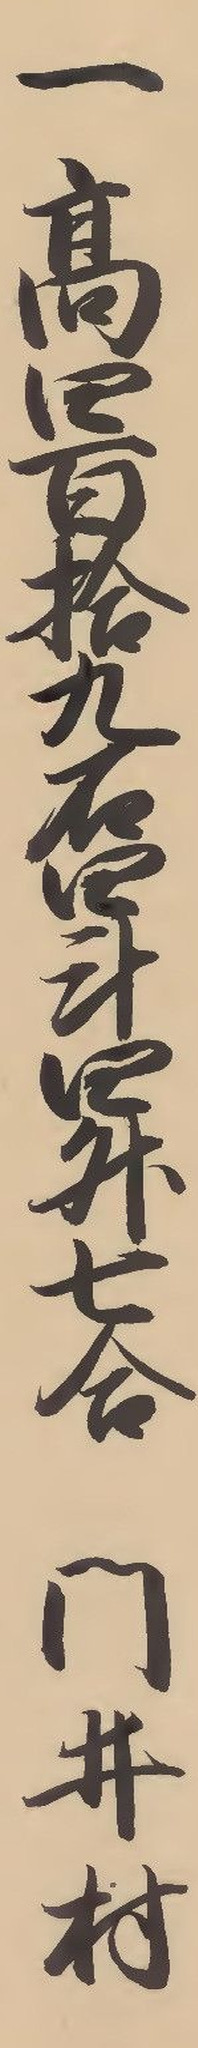一高四百拾九石四斗四升七合門井村
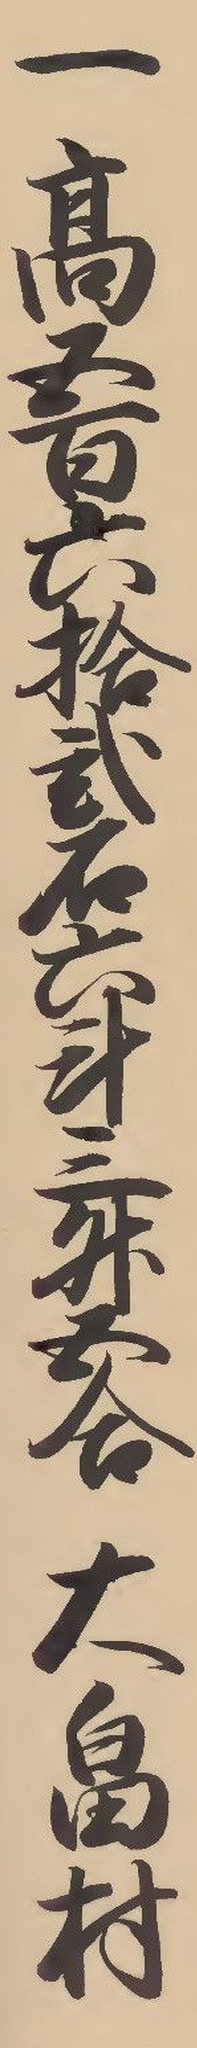一高五百六拾弐石六斗三升五合大畠村
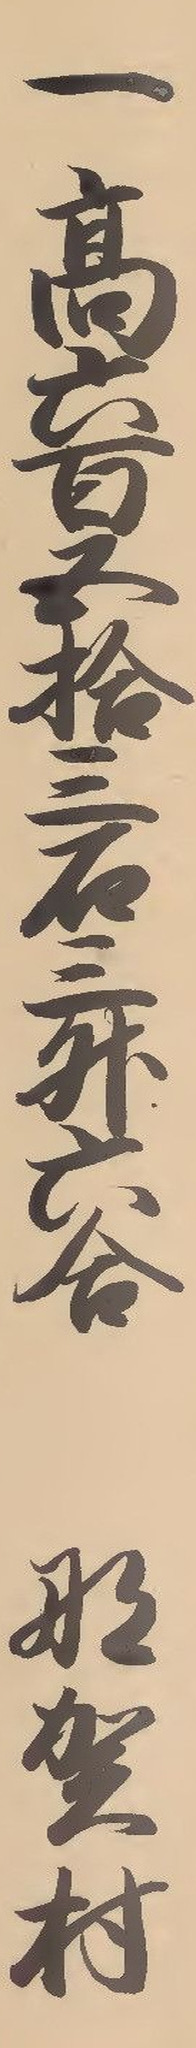一高六百五拾三石三升六合那賀村
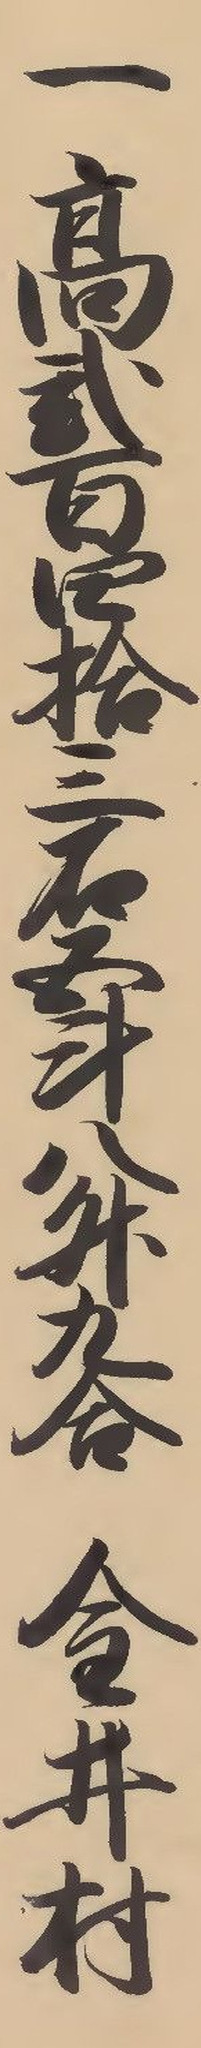一高弐百四拾三石五斗八升九合金井村
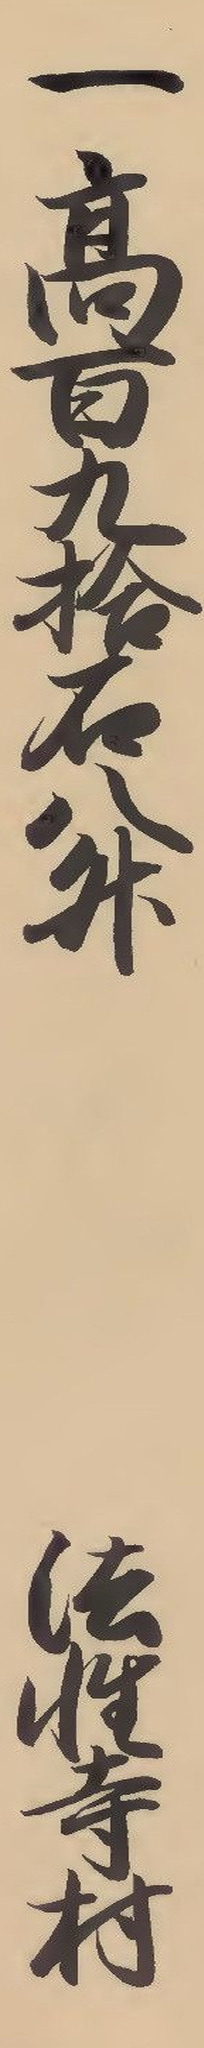一高百九拾石八升法性寺村
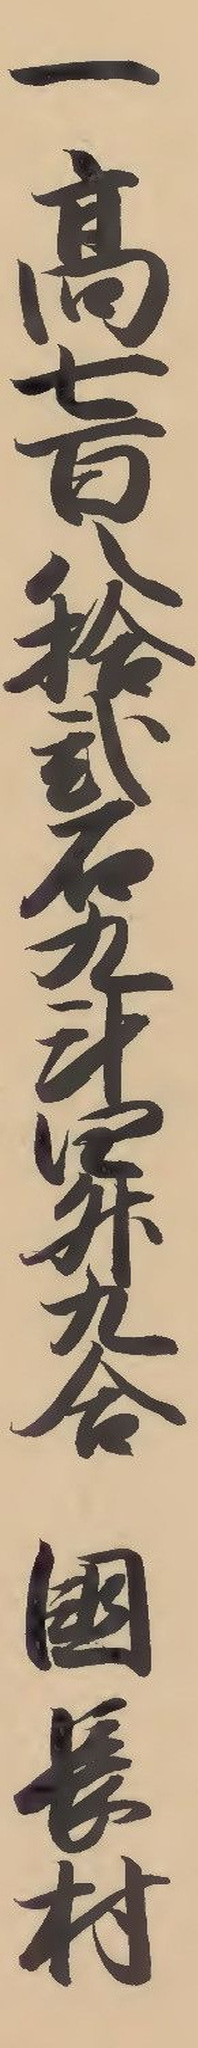一高七百八拾弐石九斗四升九合国長村

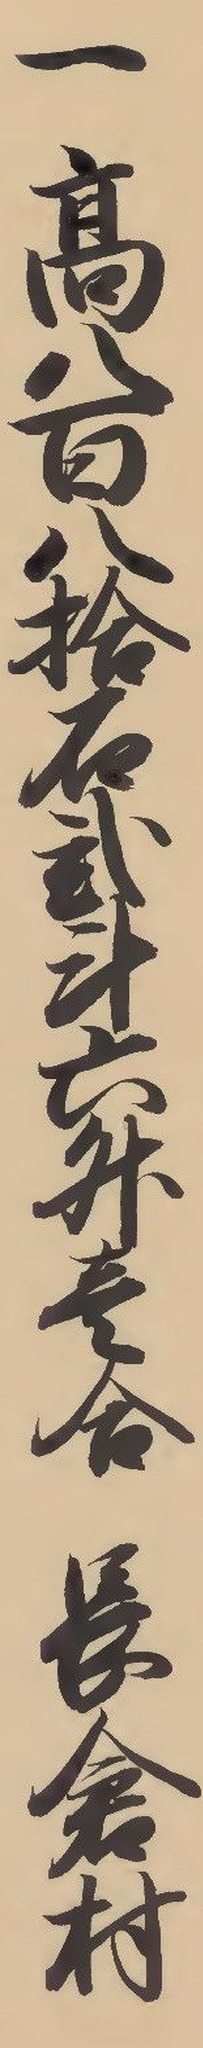一高八百八拾石弐斗六升壱合長倉村
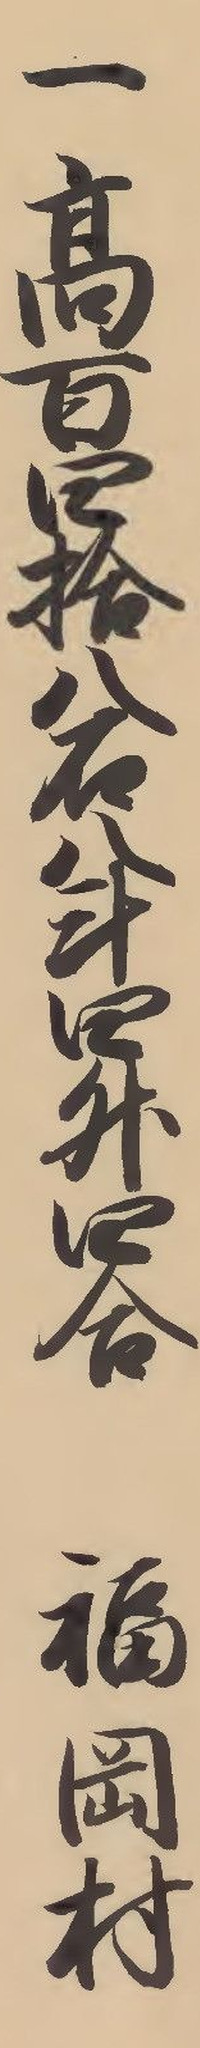一高百四拾八石八斗四升四合福岡村
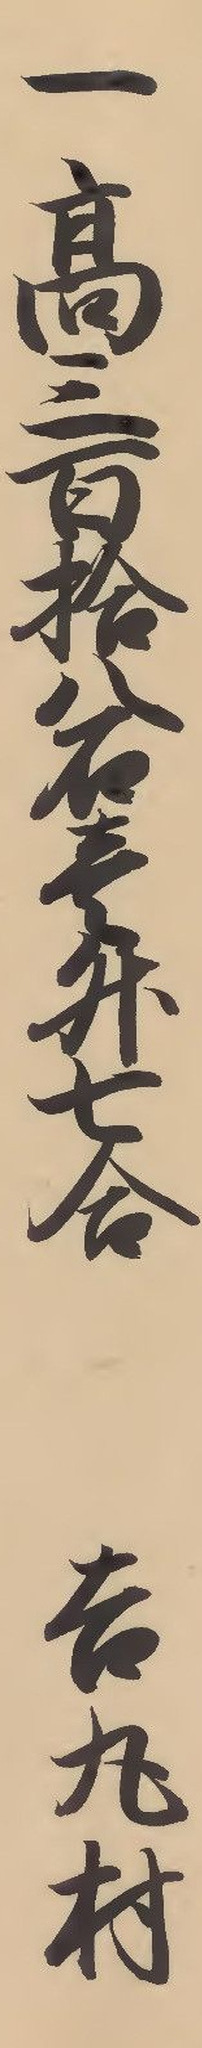一高三百拾八石壱升七合吉丸村
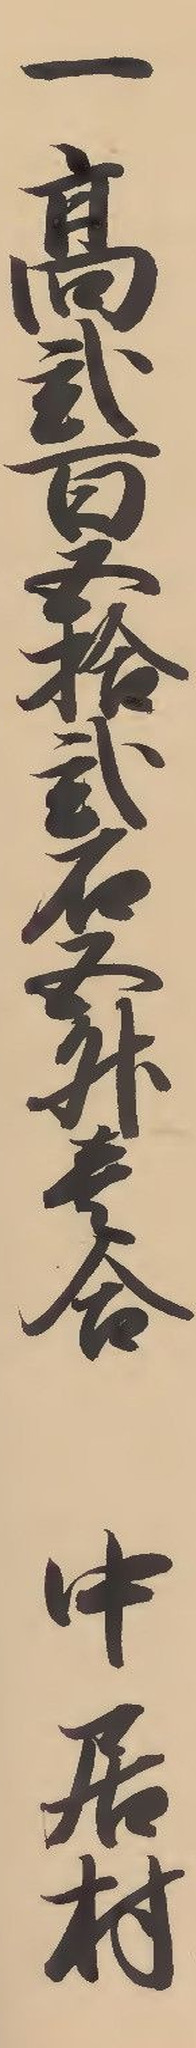一高弐百五拾弐石五升壱合中居村
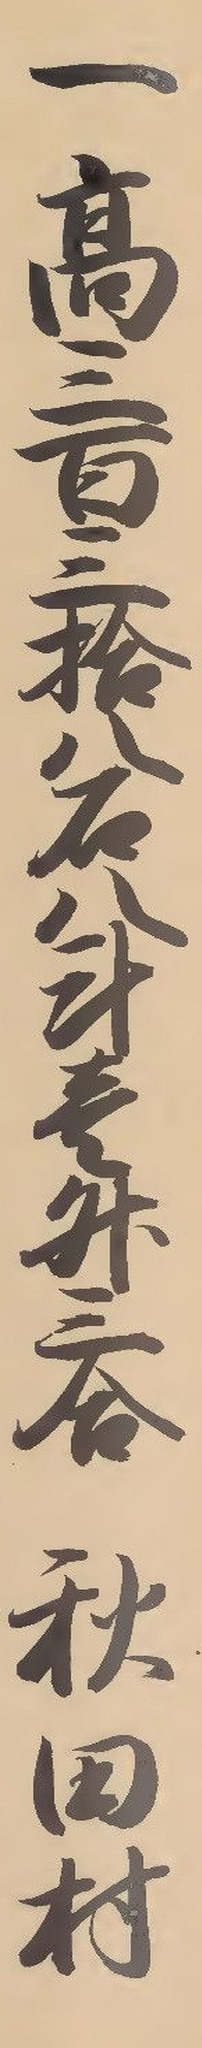一高三百三拾八石八斗壱升三合秋田村
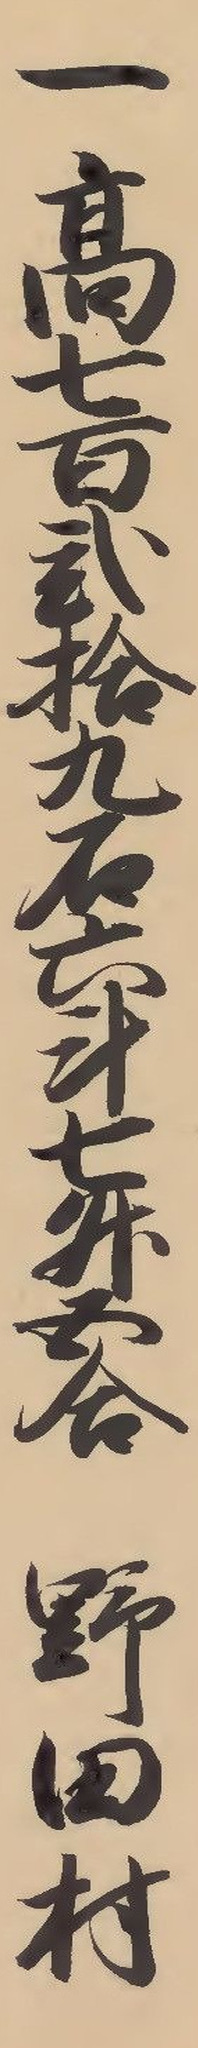一高七百弐拾九石六斗七升五合野田村
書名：常陸国郷帳
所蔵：国立公文書館 National Archives of Japan
